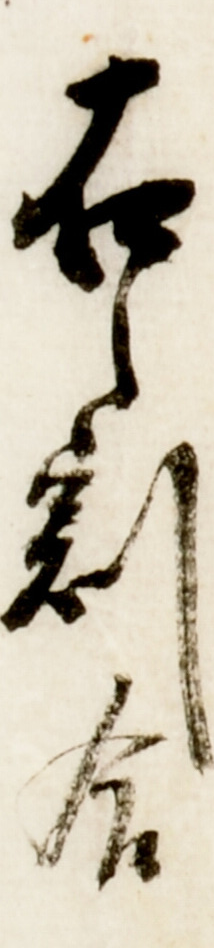右之割合

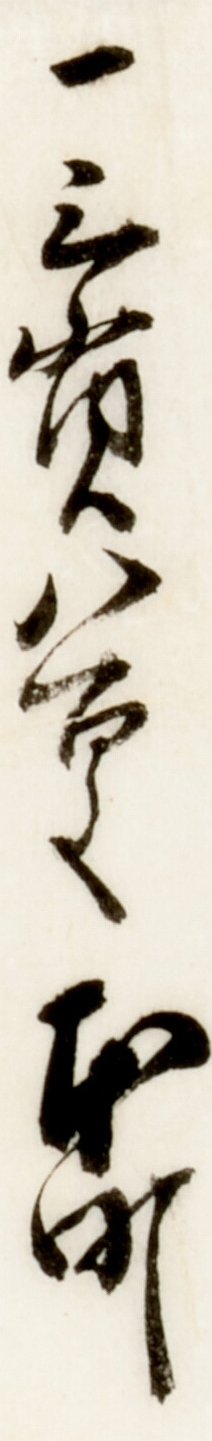一三貫八百文本町
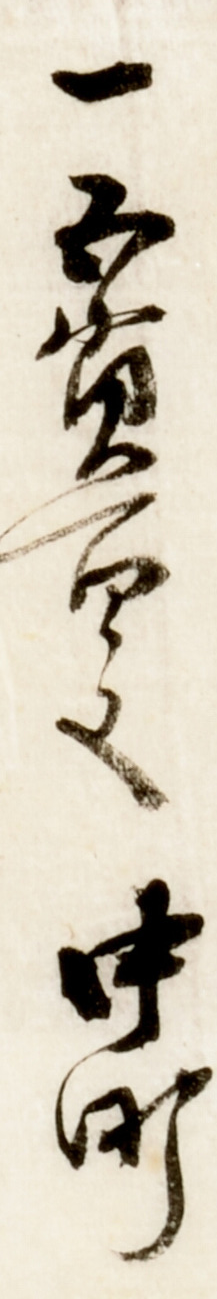一五貫百文中町
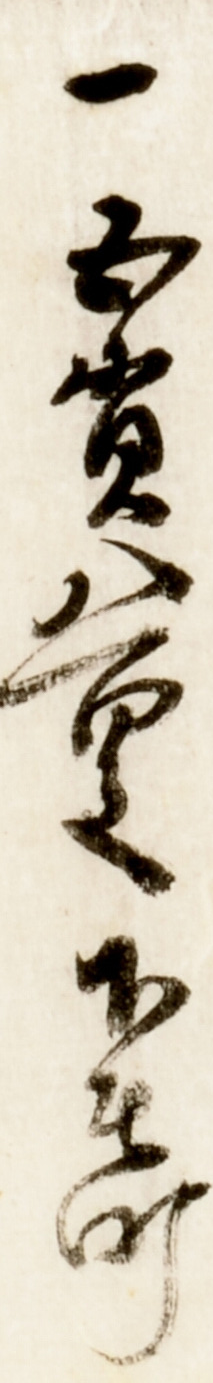一五貫八百文下モ町
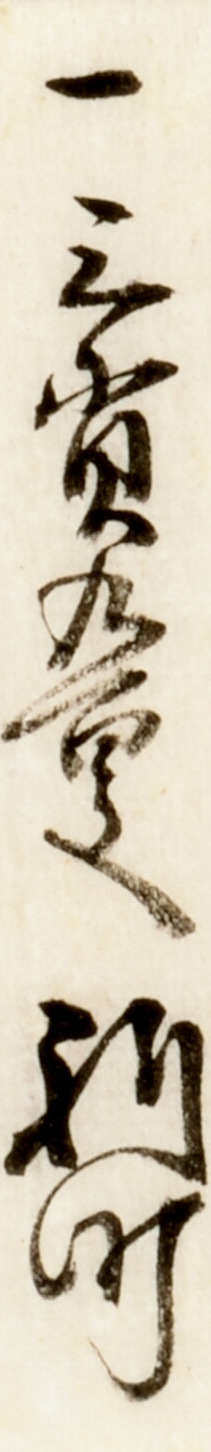一三貫九百文新町
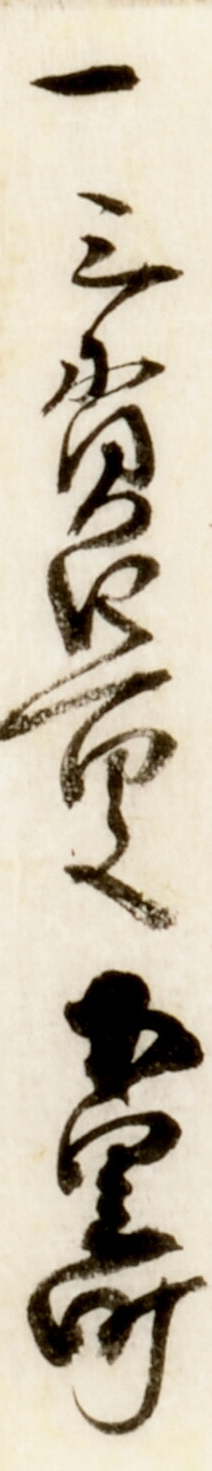一三貫四百文下里町
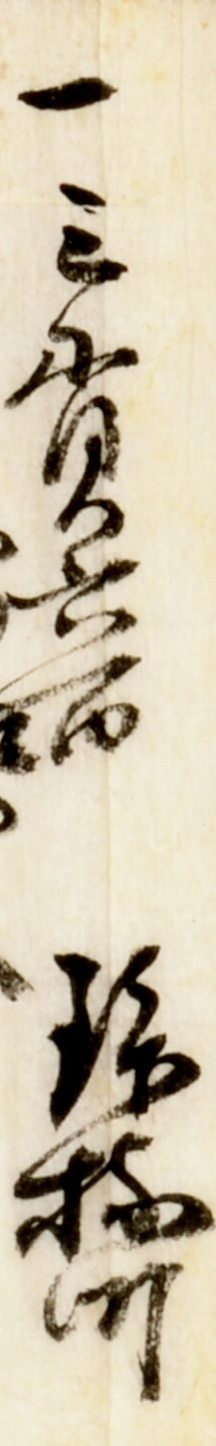一三貫六百鉾持町
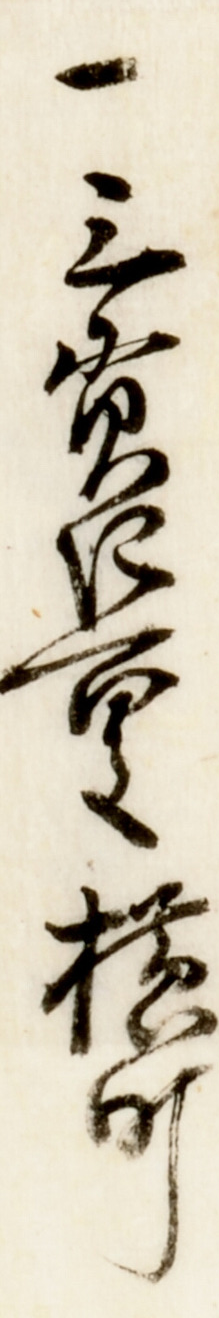一三貫四百文横町
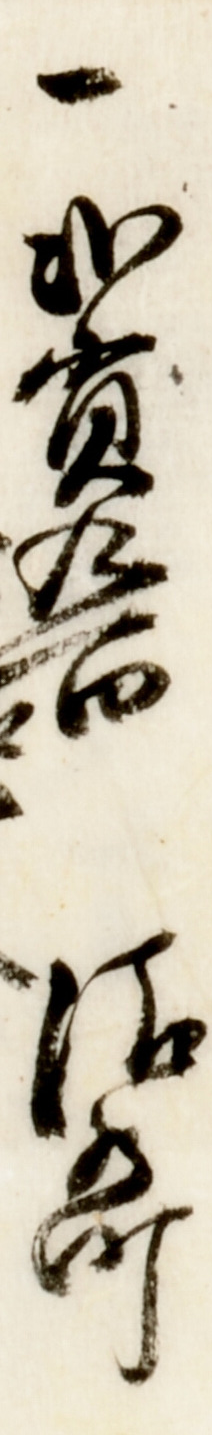一弐貫九百清水町
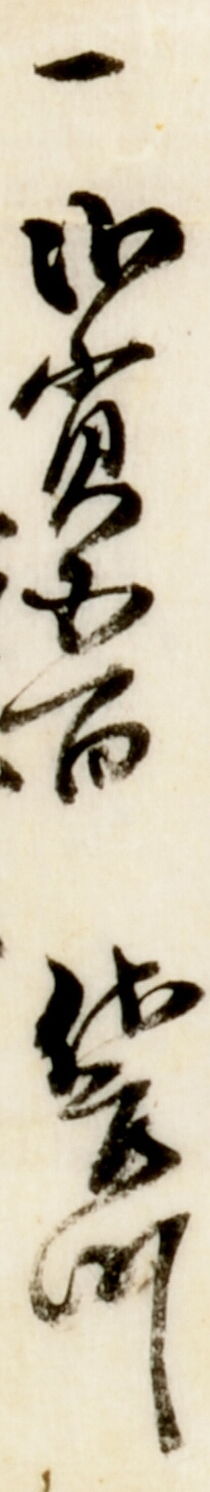一弐貫五百袋町
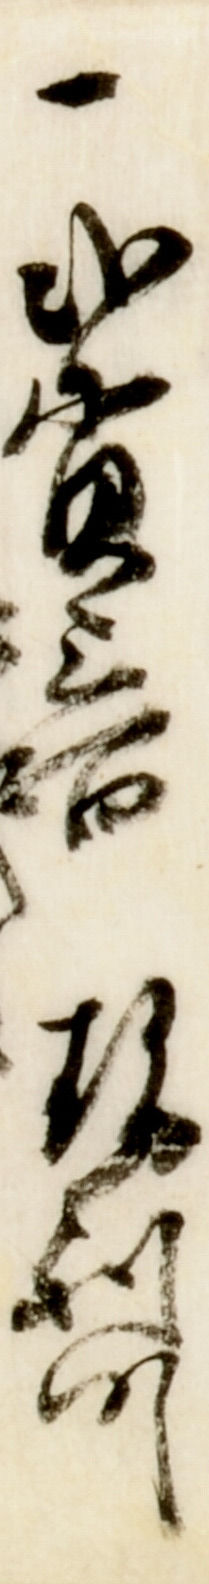一弐貫三百勢利町
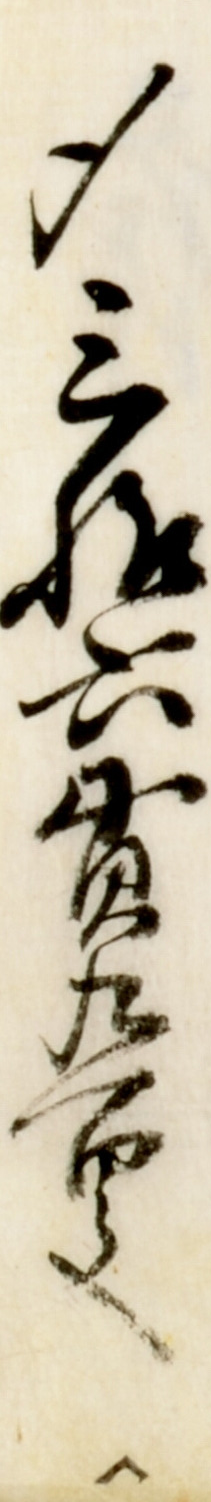〆三拾六貫九百文
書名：御泊御窺聞合わせ諸入用割合帳
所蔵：伊那市立高遠町図書館・合同会社AMANE
